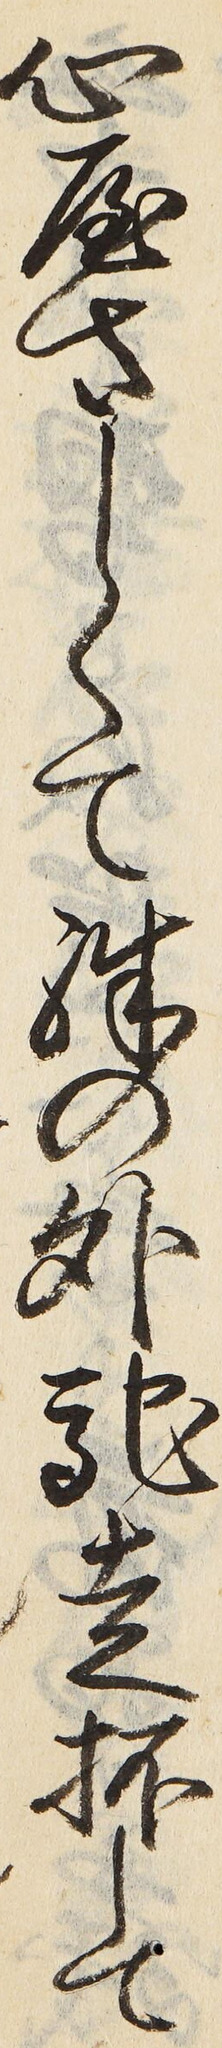心やさしくて殊の外馳走抔して
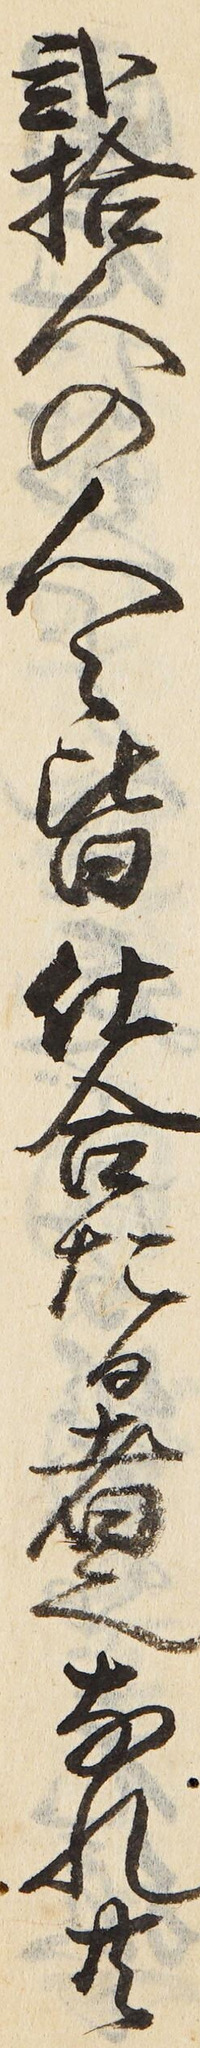弐拾人の人々皆仕合たる者也なれ共
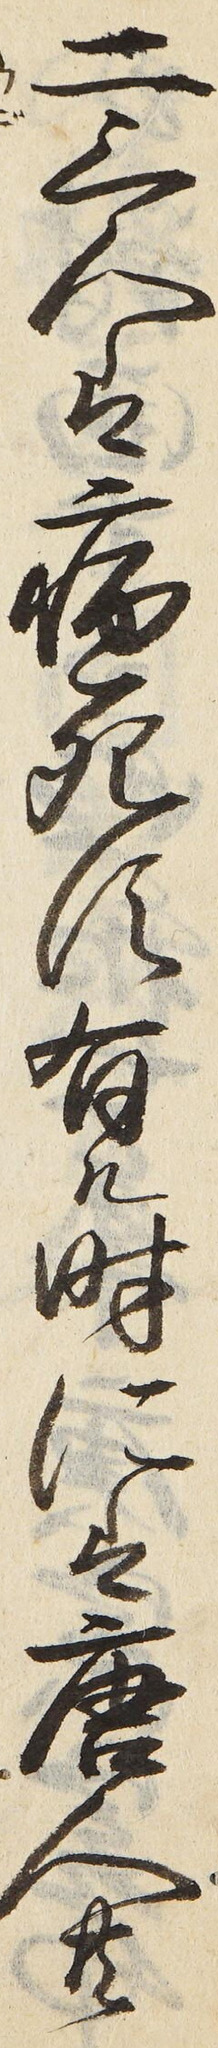二三人は病死す有る時には唐人共
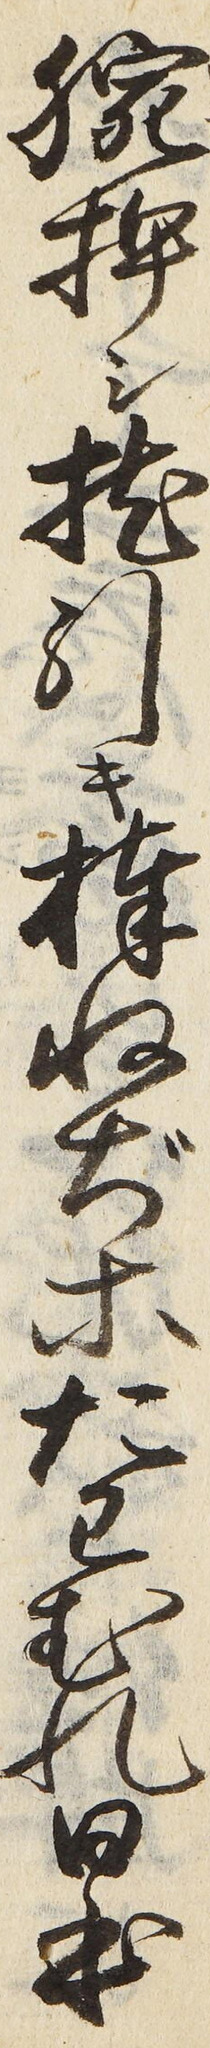腕押し枕引き棒ねぢ等たわむれ日本
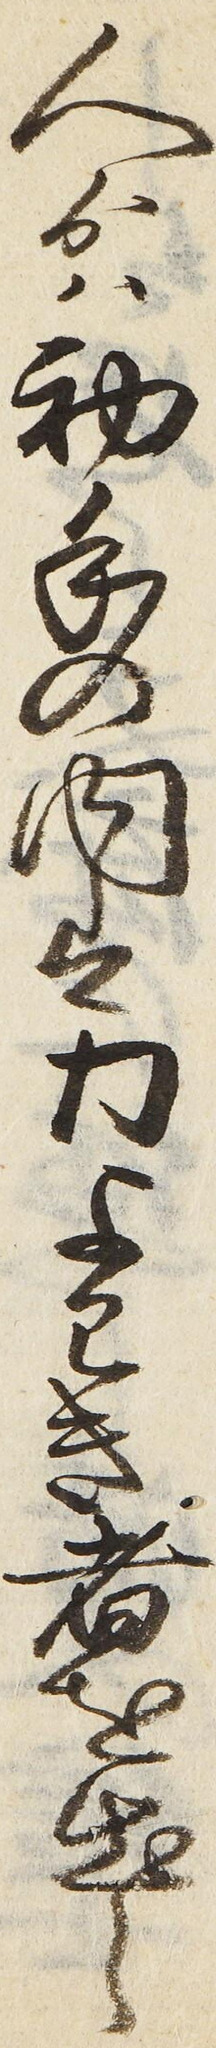人ゟは初手の内は力よわき者を出し
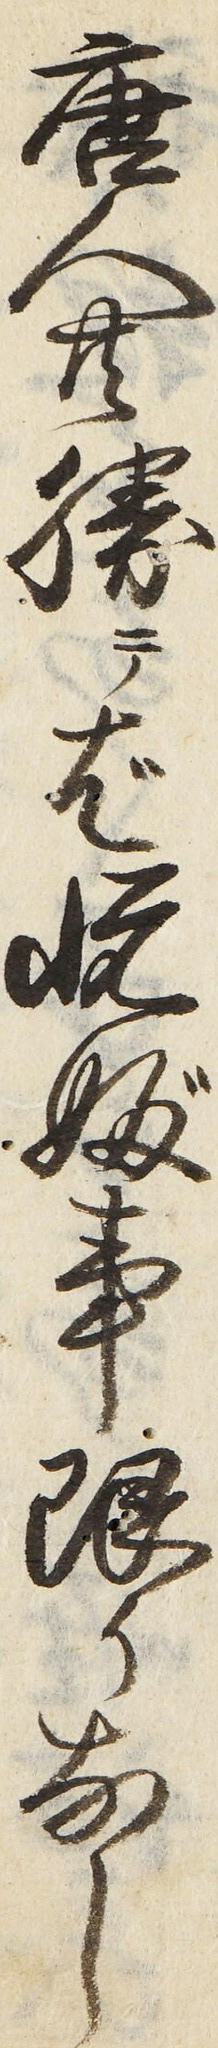唐人共勝てば悦ぶ事限りなし
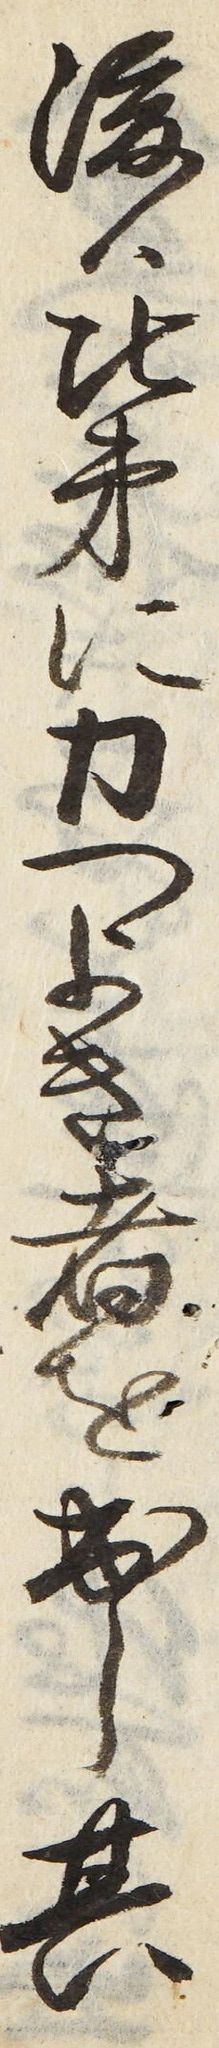後は次第に力つよき者を出し其
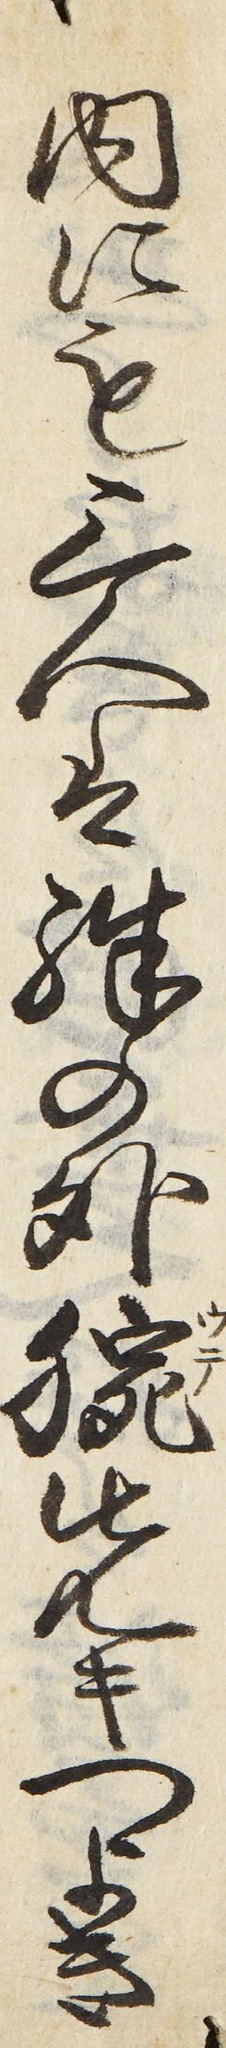内にも三人は殊の外腕先きつよき
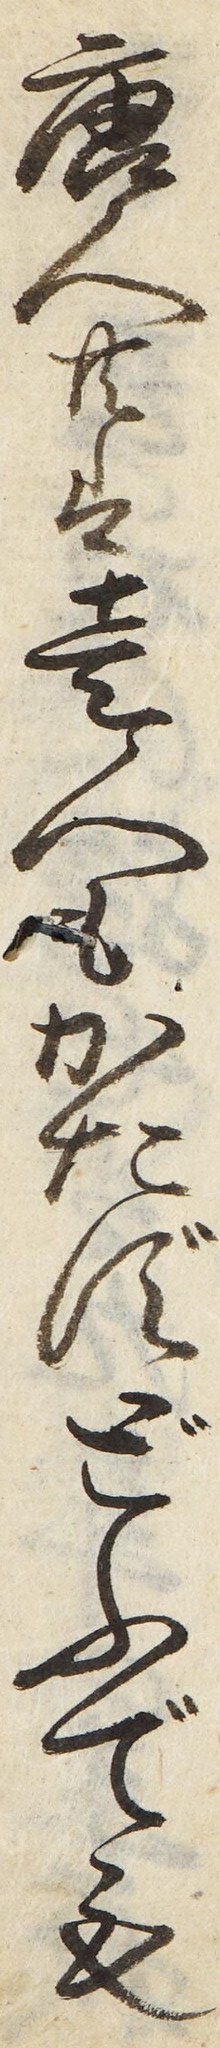唐人共は壱人もかたずどふでも
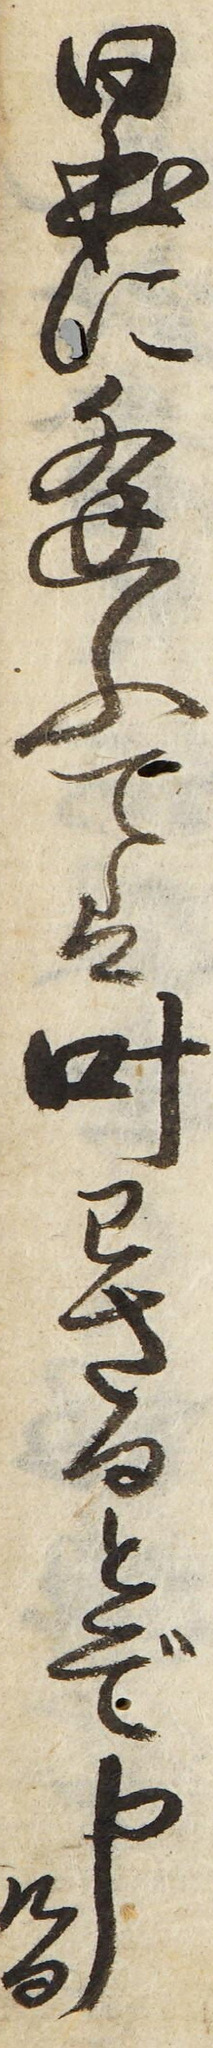日本に逢ふては叶わさるとぞ申しける

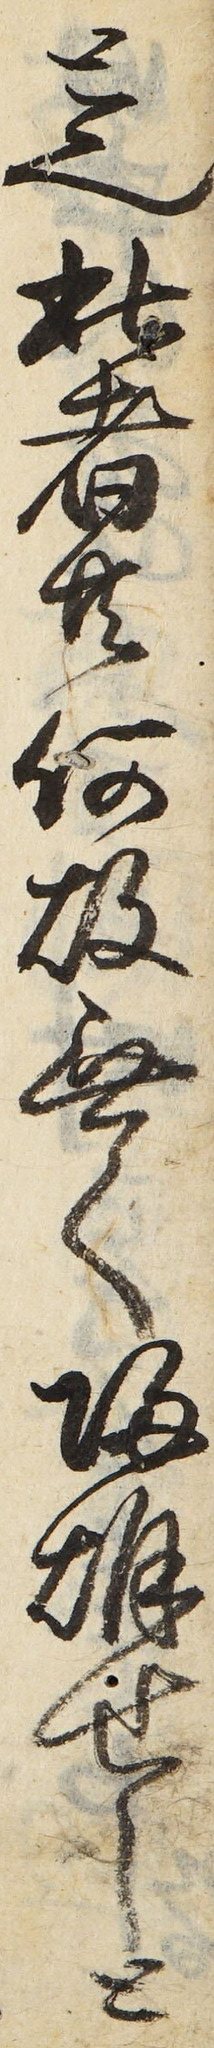と也此者共何故無く帰朝せしと
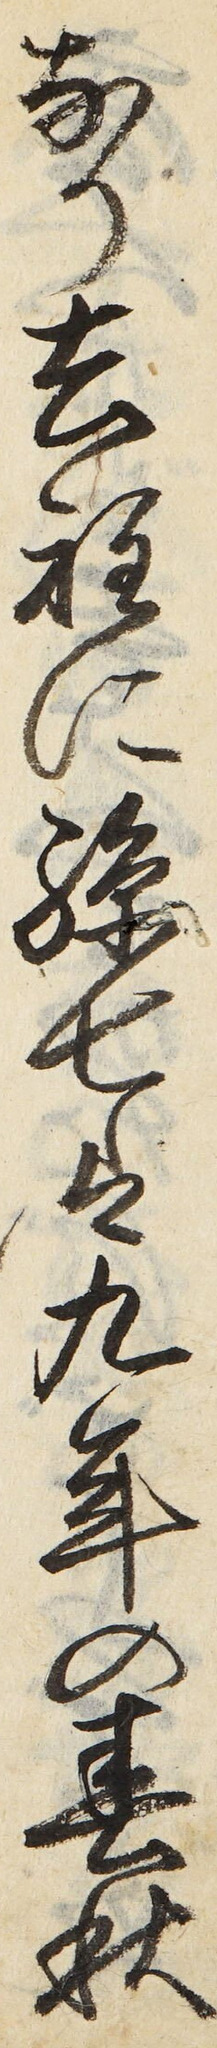なり去程に孫七は九年の春秋
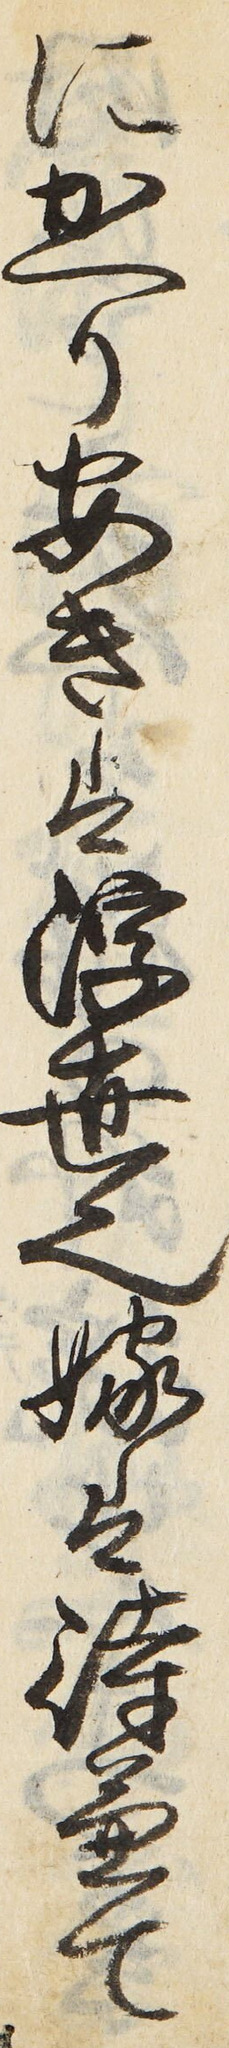にかへり安きは浮世也嫁は待兼て
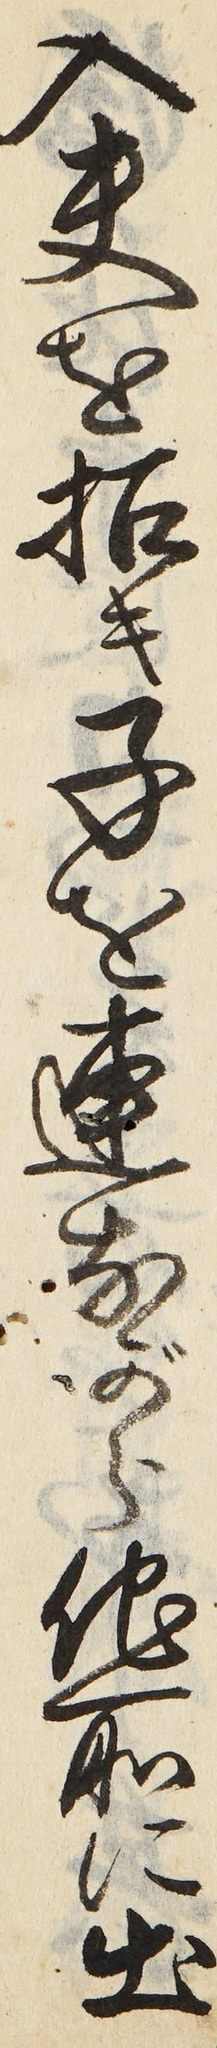入夫を招き子を連ながら他所に出
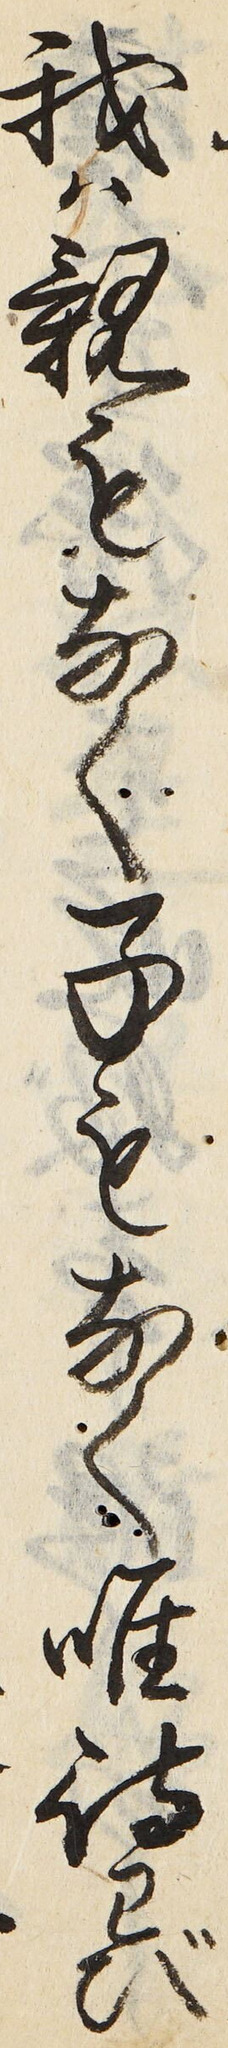我は親もなく子もなく唯待わび
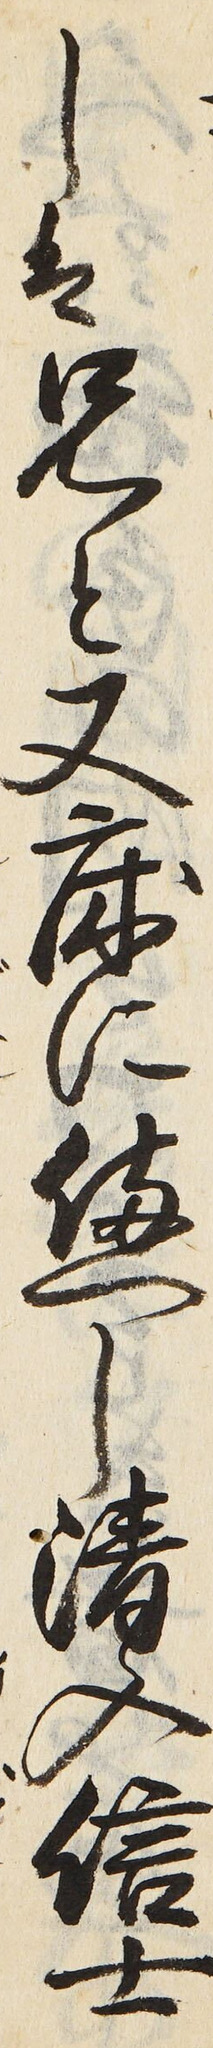しは兄と又床に備へし清入信士
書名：華夷九年録
